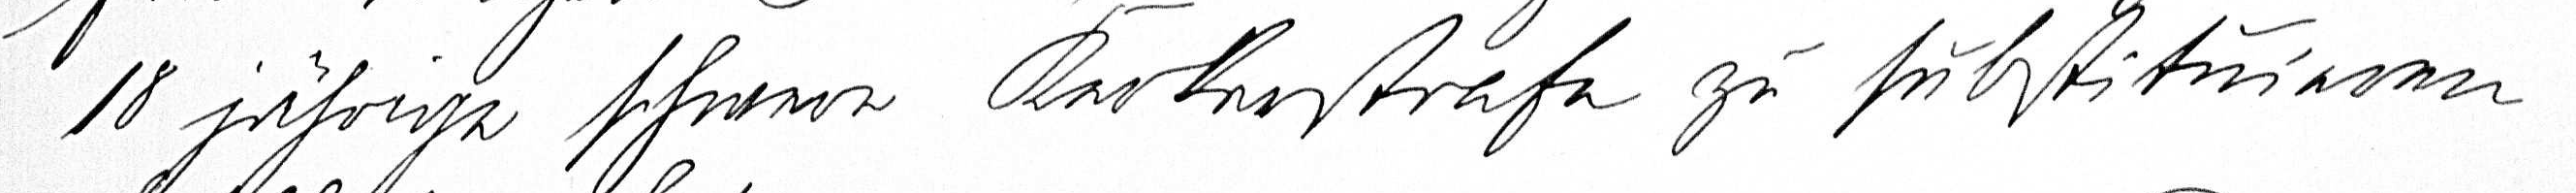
18jährige schwere Kerkerstrafe zu substituieren
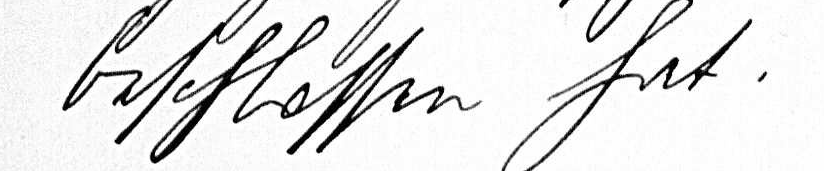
beschlossen hat.
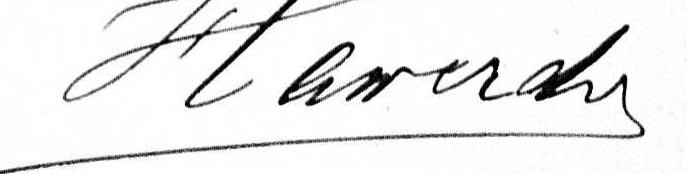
Hawerda
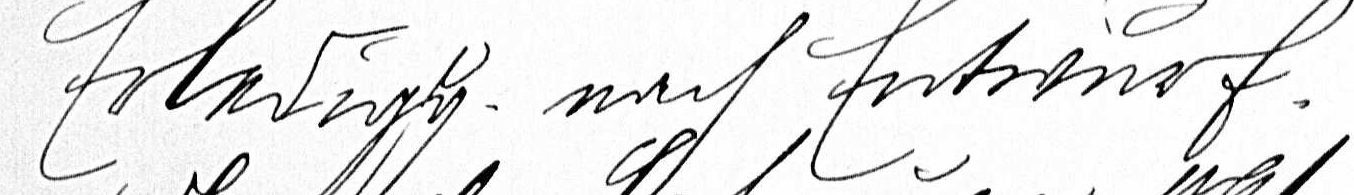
Erledigung nach Entwurf
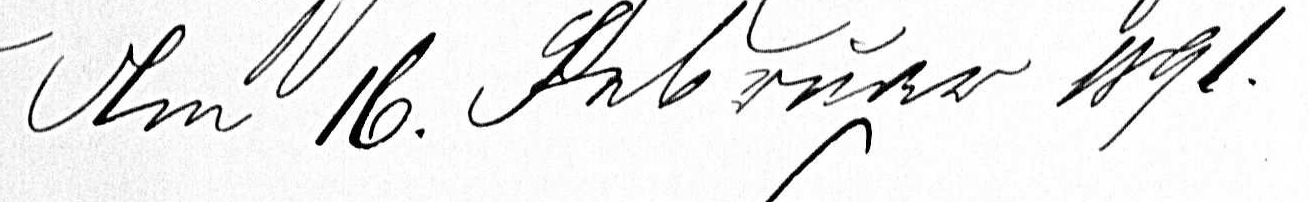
Am 16. February 1891
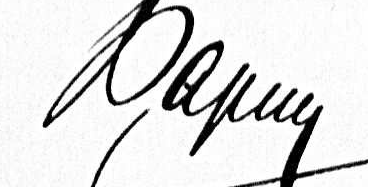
Papay
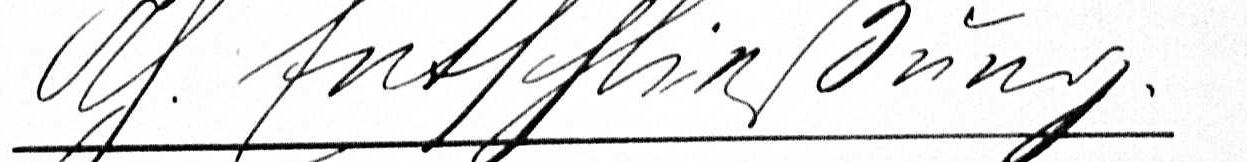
Ah. Entschließung
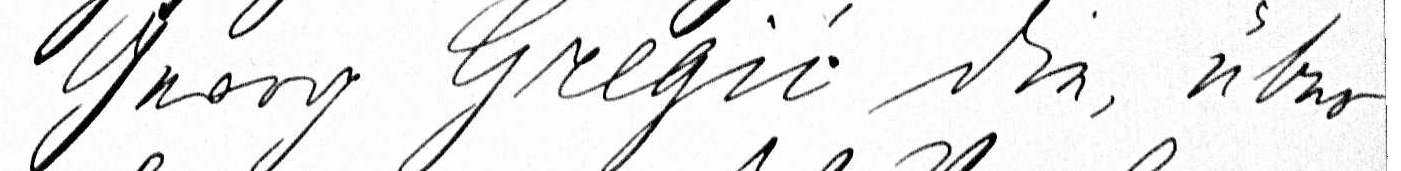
Georg Gregić die, über
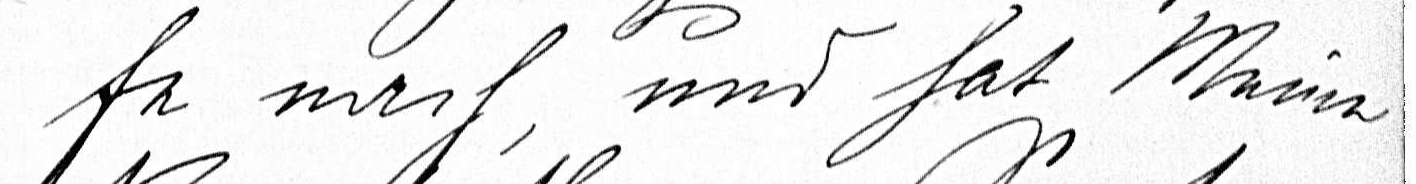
fe nach, und hat Meine
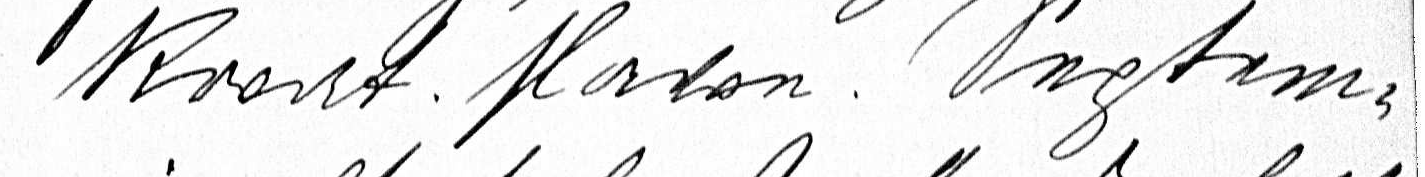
Kroat. slavon. Septem¬
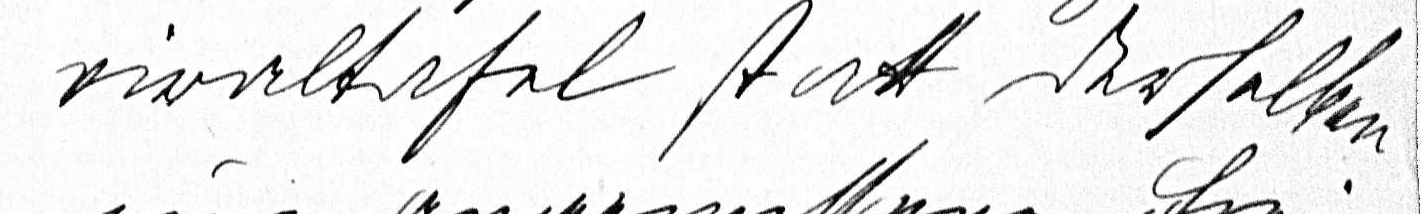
viraltafel statt derselben
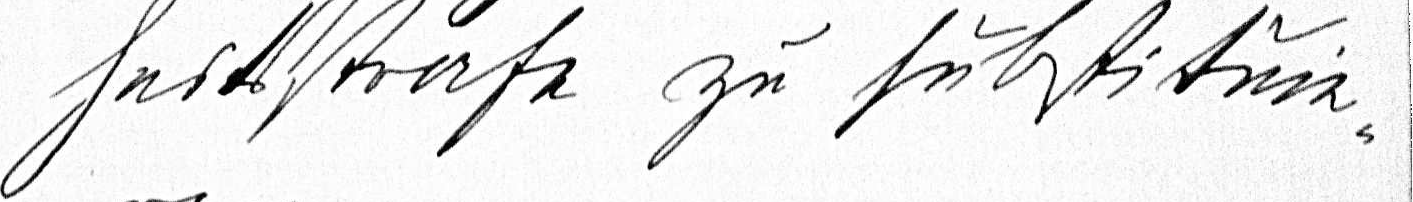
heitsstrafe zu substituie¬
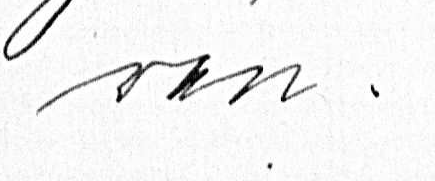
ren.
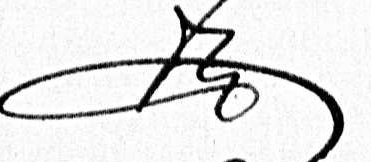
FJ
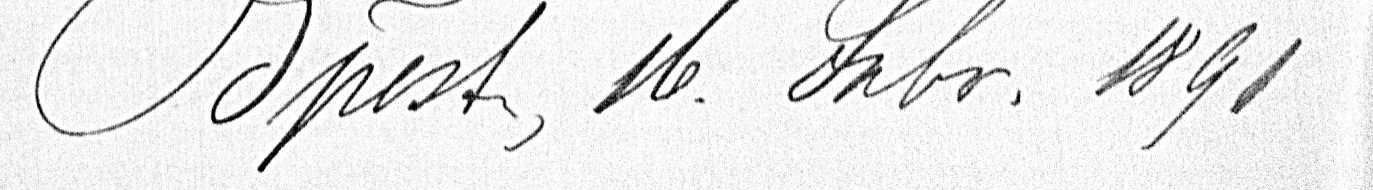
Bpest, 16. Febr. 1891
